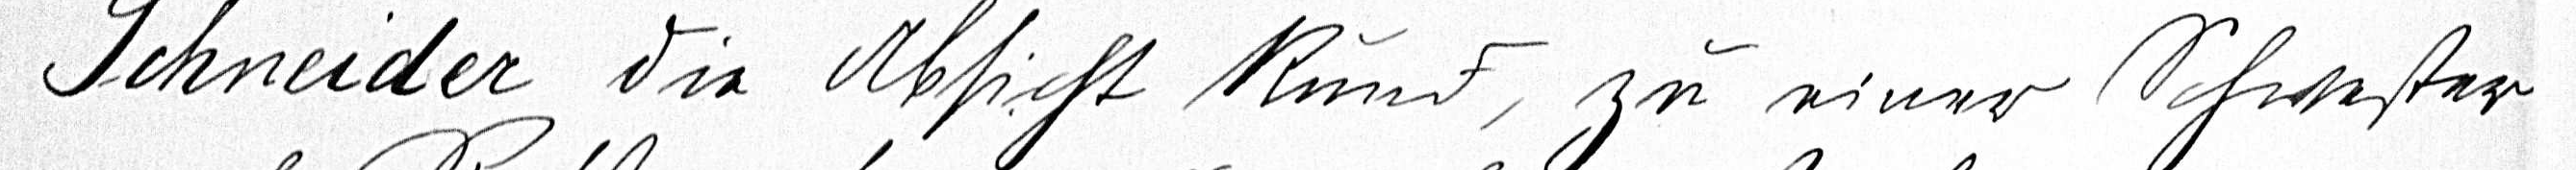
Schneider die Absicht Kund, zu einer Schwester
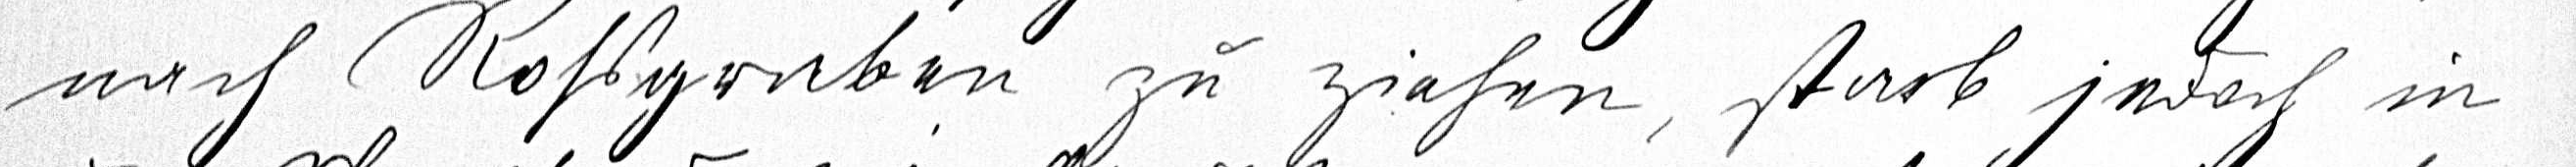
nach Roßgraben zu ziehen, starb jedoch in
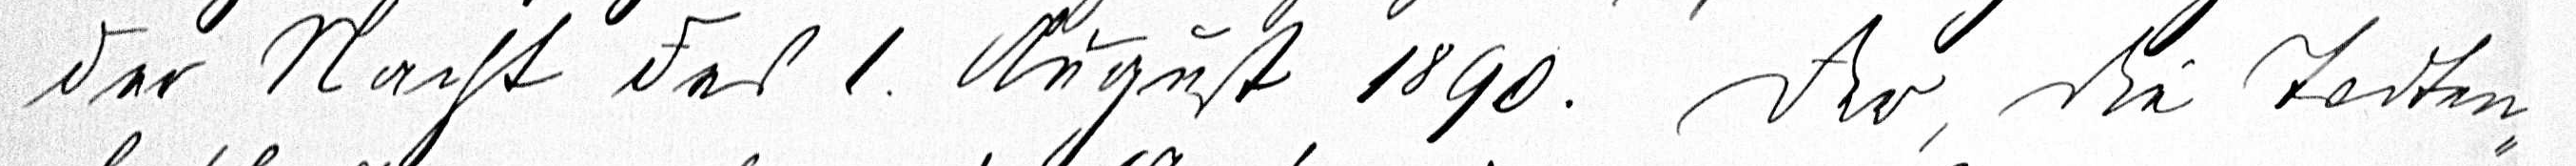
der Nacht des 1. August 1890. Der, die Todten¬
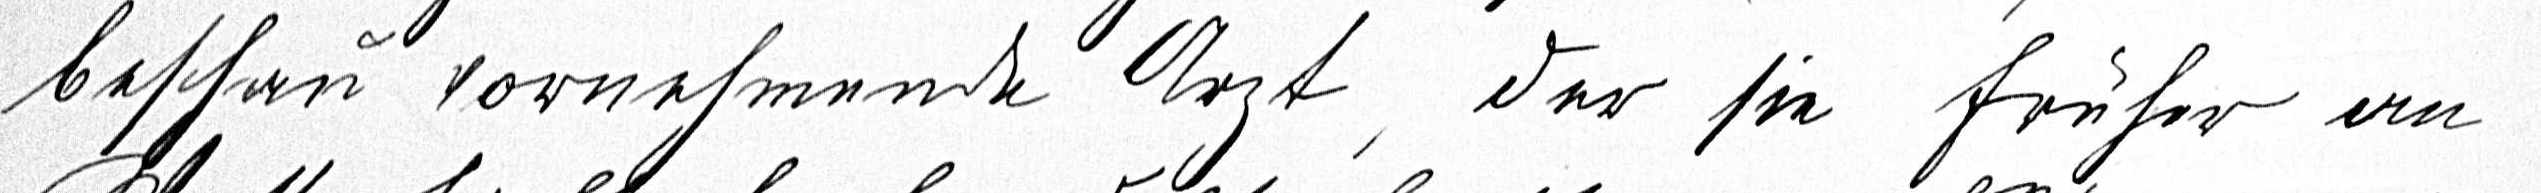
beschau vornehmende Arzt, der sie früher an
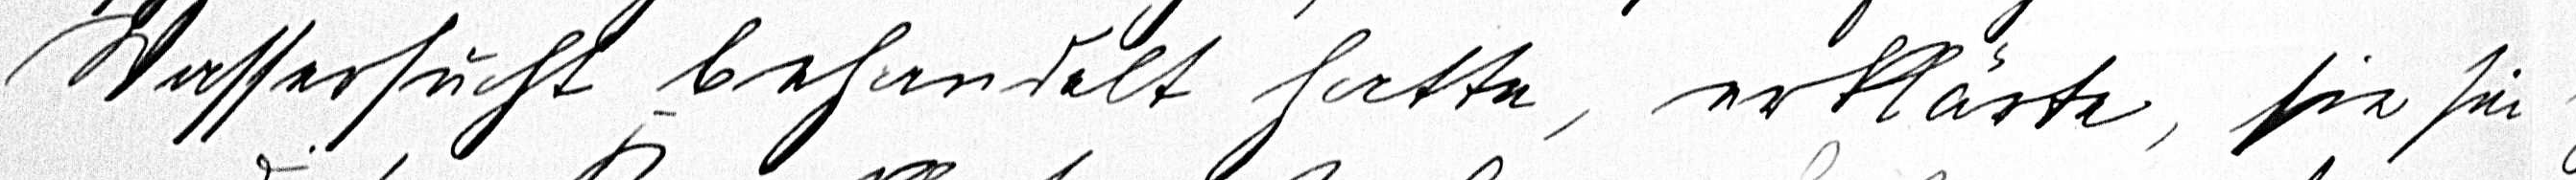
Wassersucht behandelt hatte, erklärte, sie sei
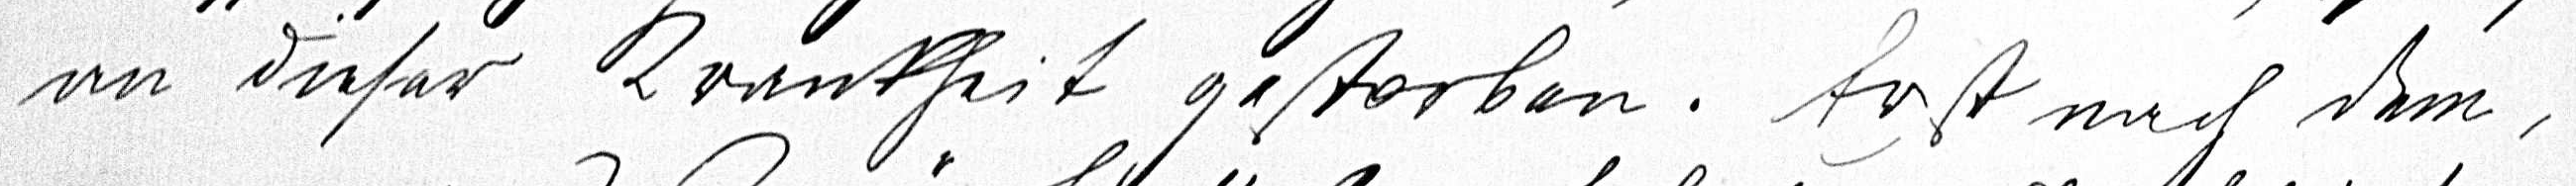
an dieser Krankheit gestorben. Erst nach dem,
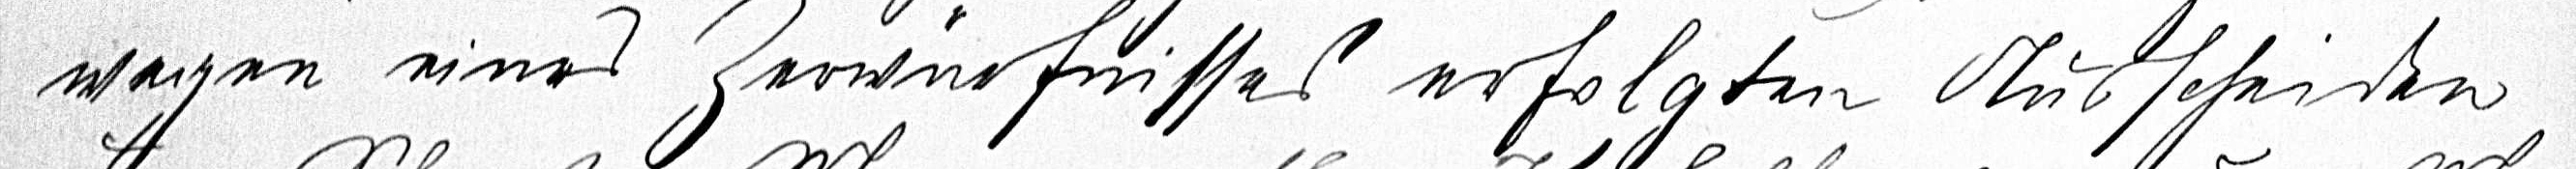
wegen eines Zerwürfnisses erfolgten Ausscheiden
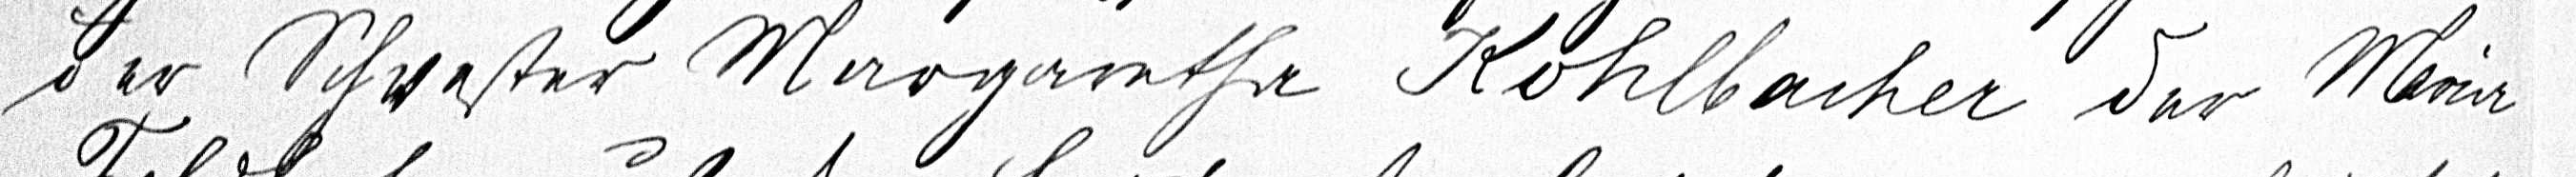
der Schwester Margaretha Kohlbacher der Maria
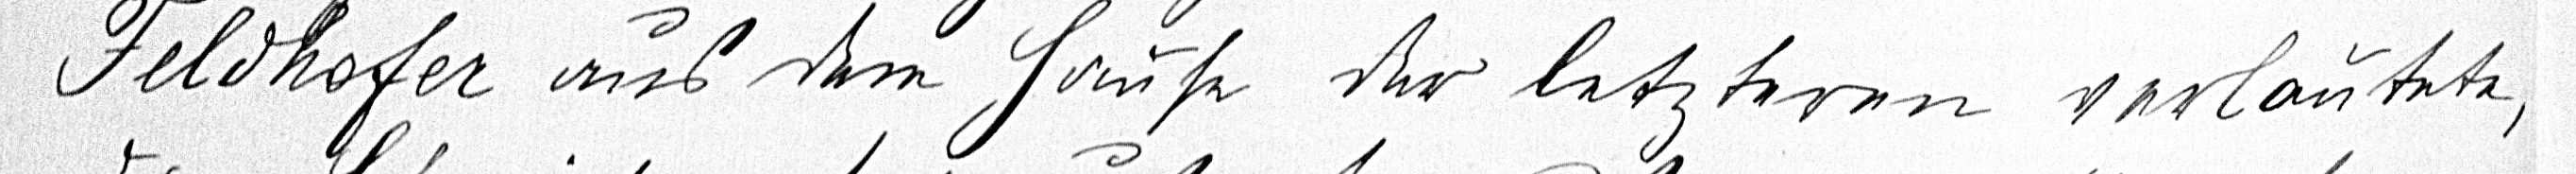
Feldhofer aus dem Hause der letzteren verlautete,
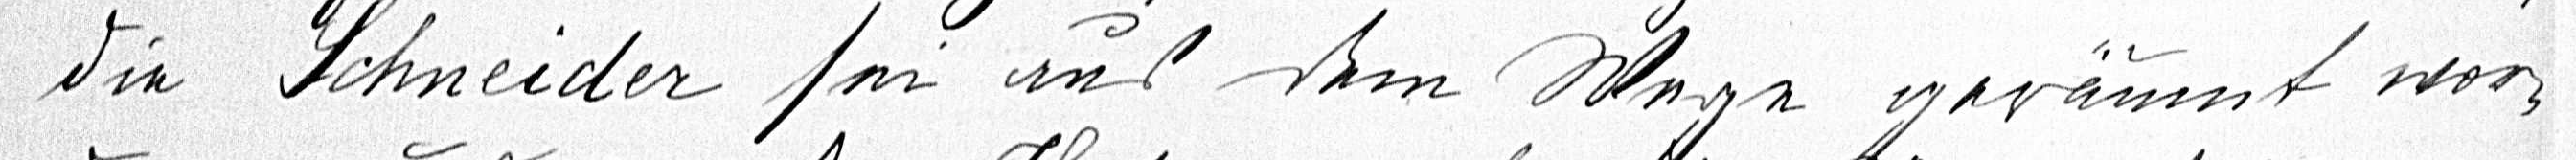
die Schneider sei aus dem Wege geräumt wor¬
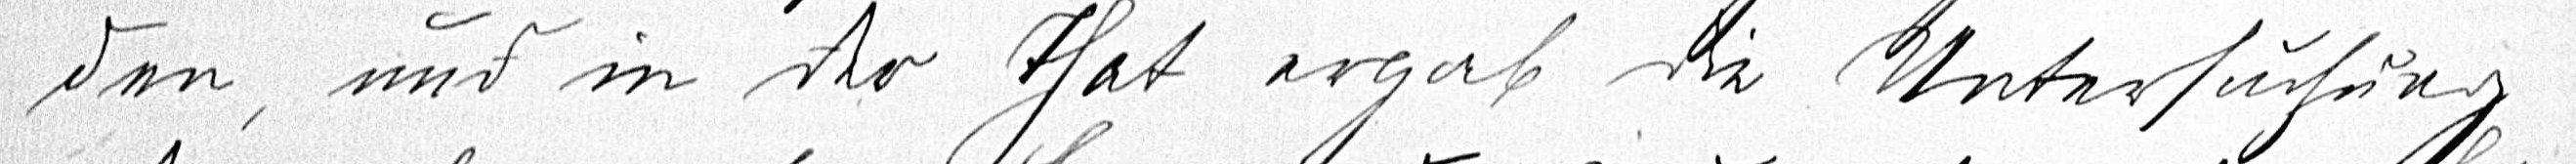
den, und in der That ergab die Untersuchung
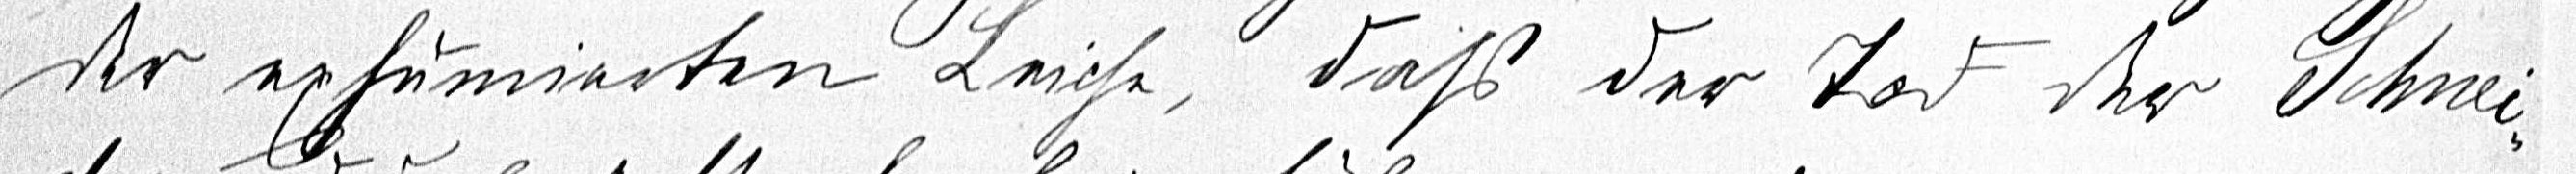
der exhumierten Leiche, daß der Tod der Schnei¬
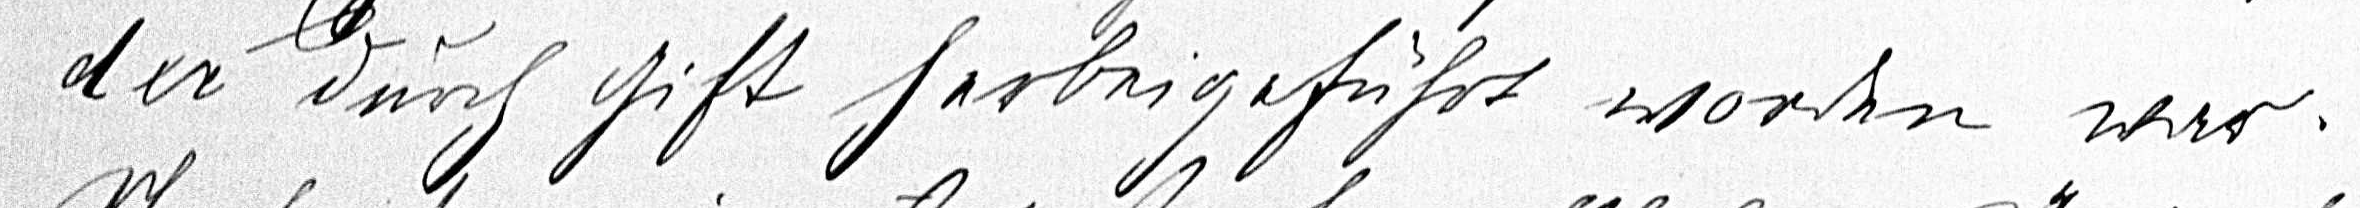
der durch Gift herbeigeführt worden war.
